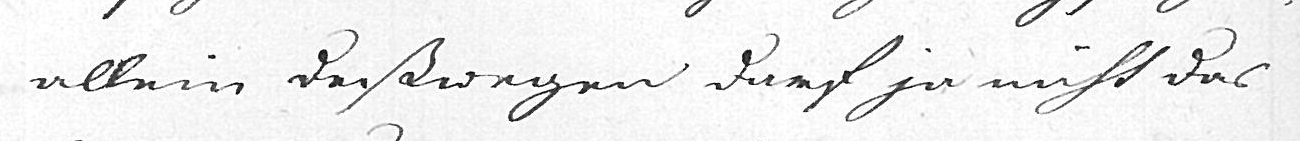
allein deßwegen darf ja nicht das
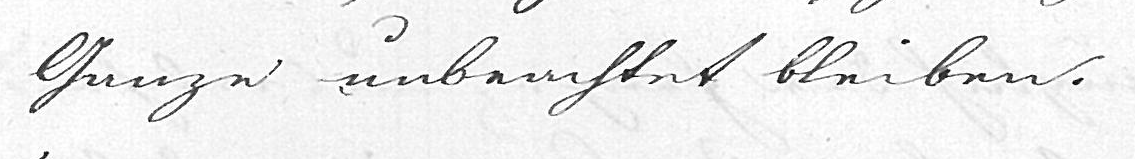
Ganze unbeachtet bleiben.
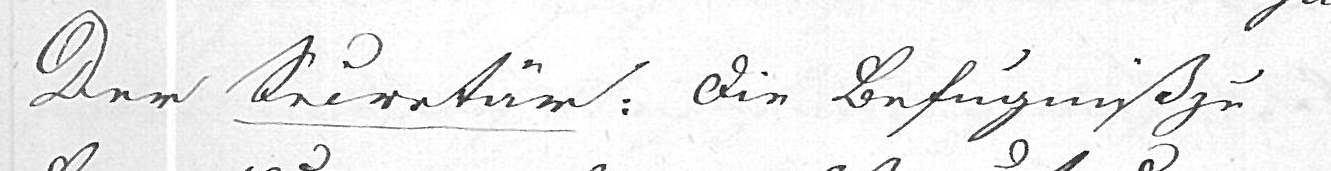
Der Secretär: Die Befugniß zu
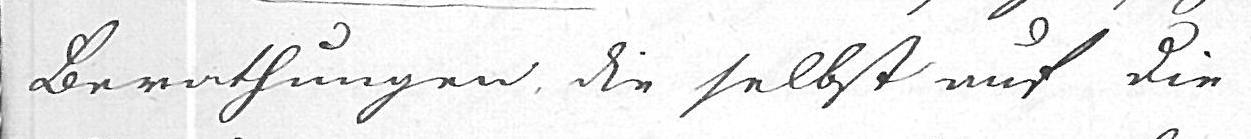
Berathungen, die selbst auf die
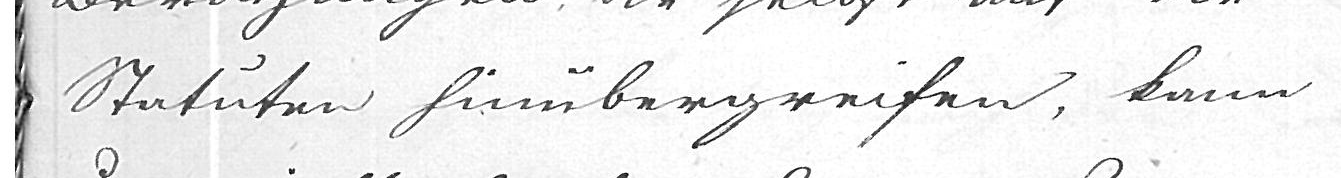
Statuten hinübergreifen, kann
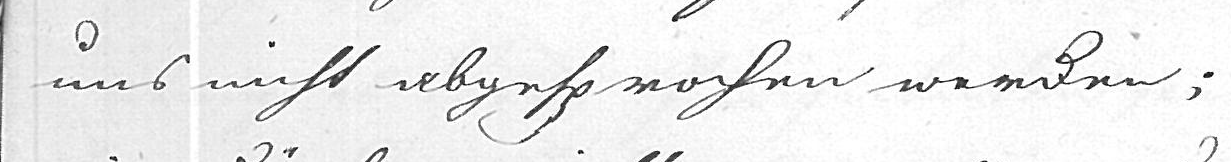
uns nicht abgesprochen werden;
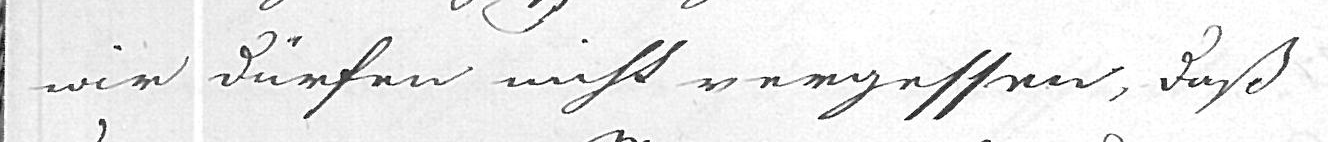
wir dürfen nicht vergessen, daß
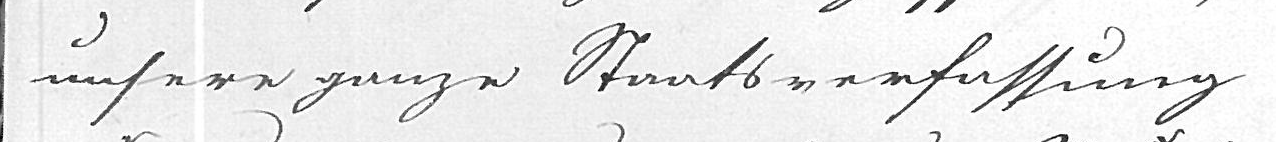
unsere ganze Staatverfassung
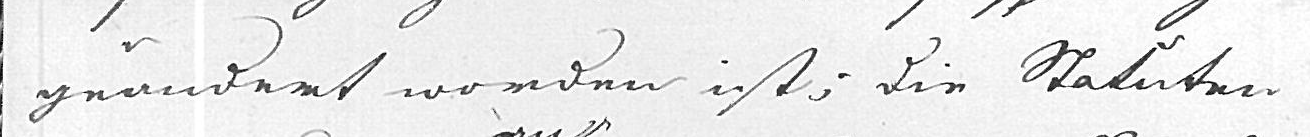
geändert worden ist; die Statuten
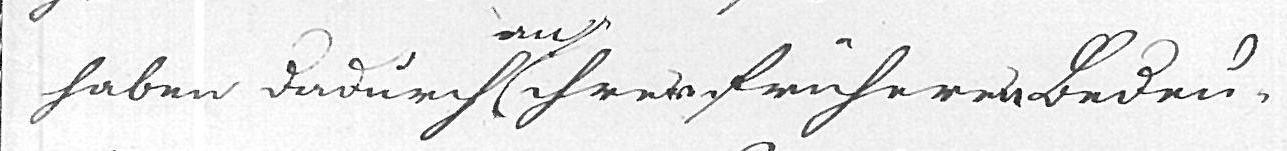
haben dadurch an ihrer früheren Bedeu-
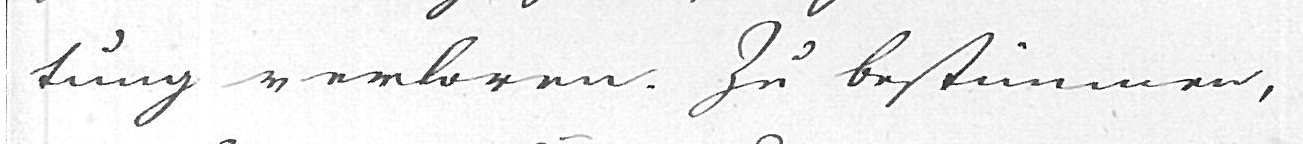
tung verloren. Zu bestimmen,
